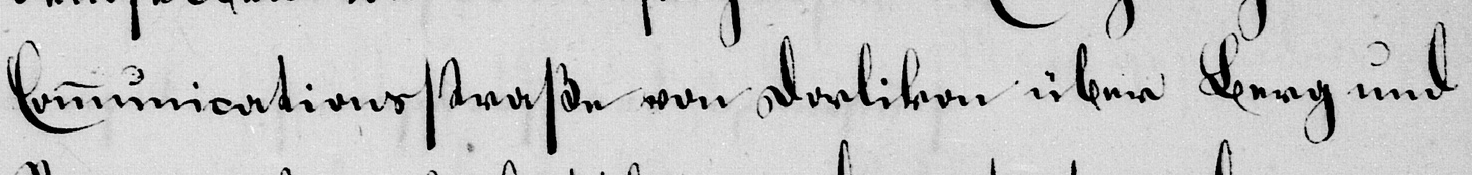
Communicationsstraße von Derlikon über Berg und
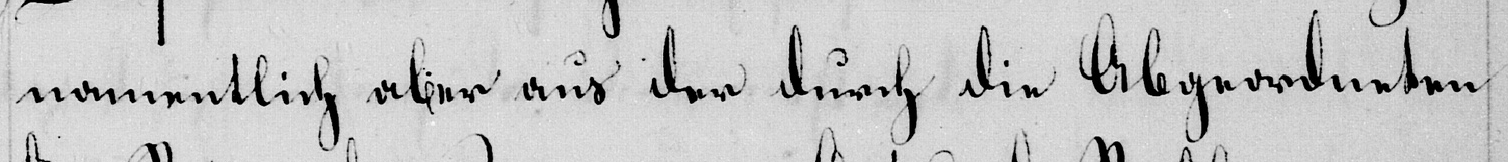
namentlich aber aus der durch die Abgeordneten
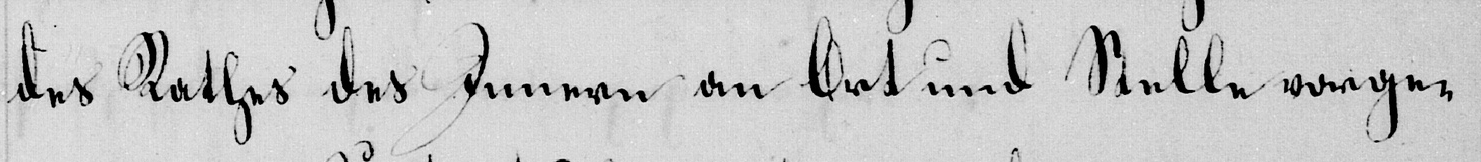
des Rathes des Innern an Ort und Stelle vorge¬
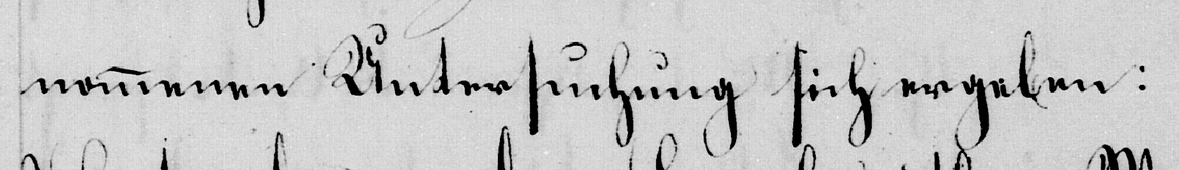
nommenen Untersuchung sich ergaben:
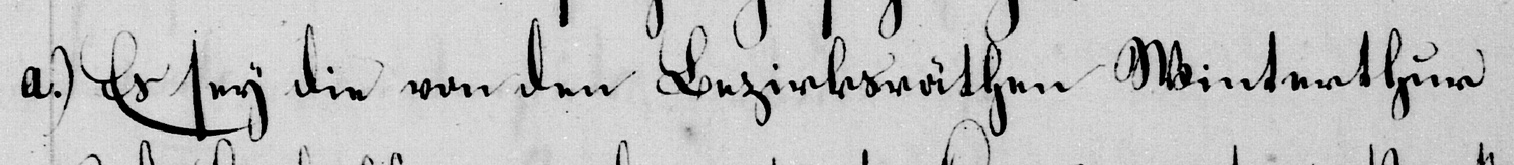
a.) Es sey die von den Bezirksräthen Winterthur
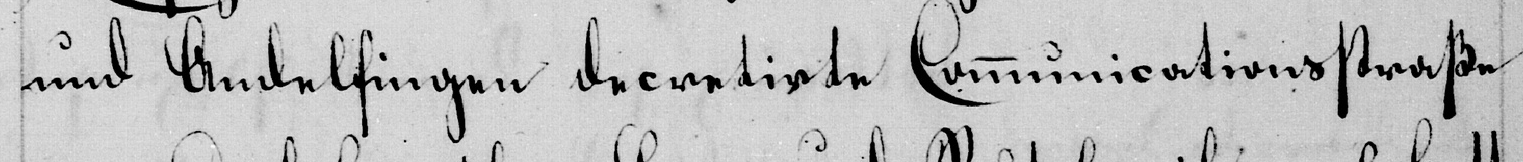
und Andelfingen decretirte Communicationsstraße
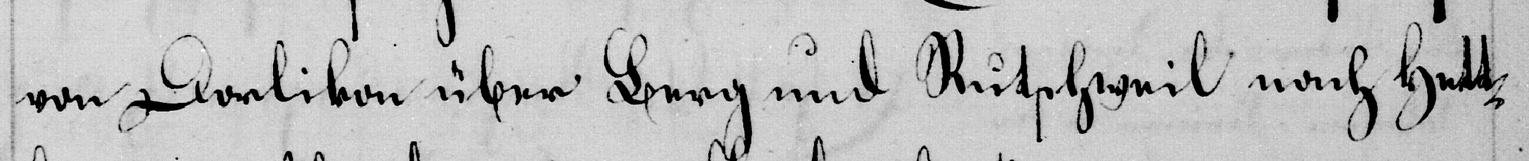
von Derlikon über Berg und Rutschweil nach Hett¬
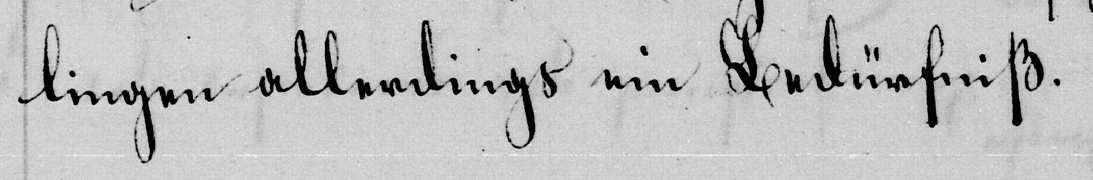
lingen allerdings ein Bedürfniß.
